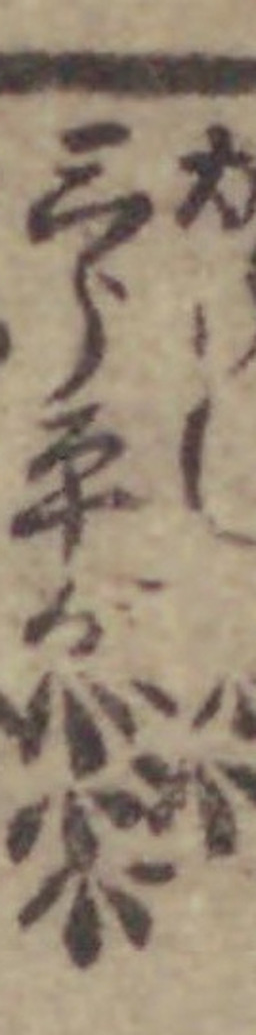三郎平がめ
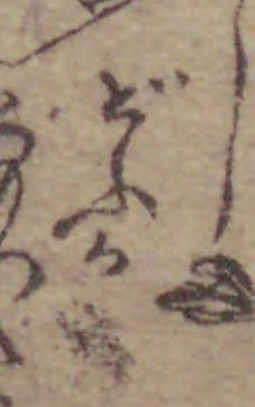どふか
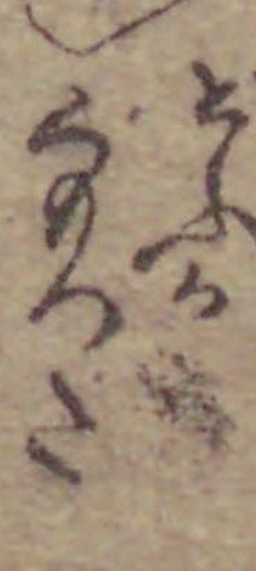くもつた
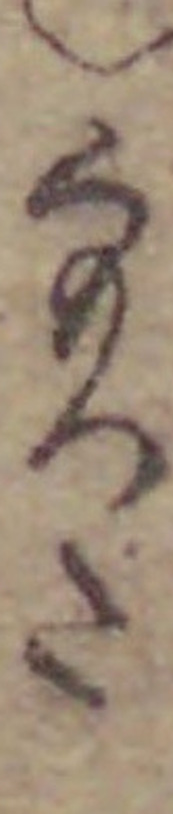くもつた
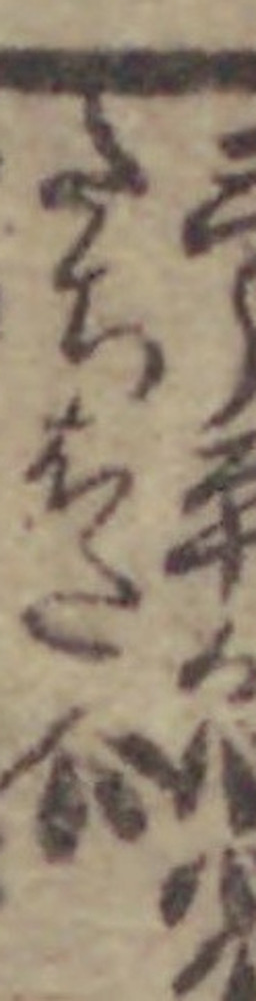たちはた
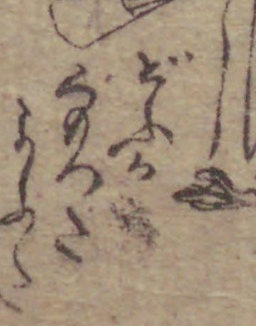どふか
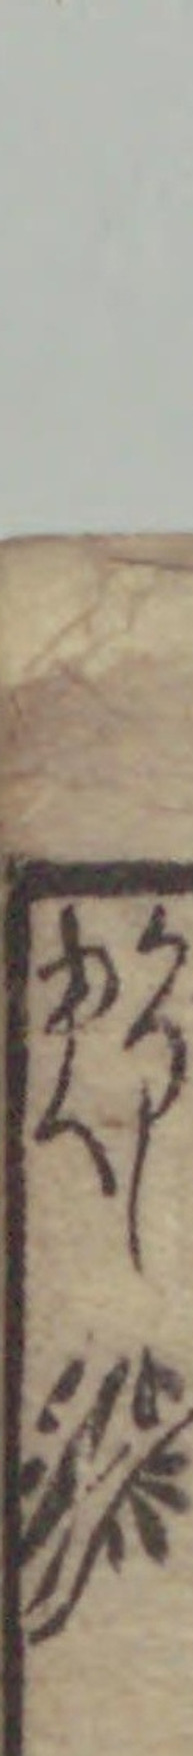からし
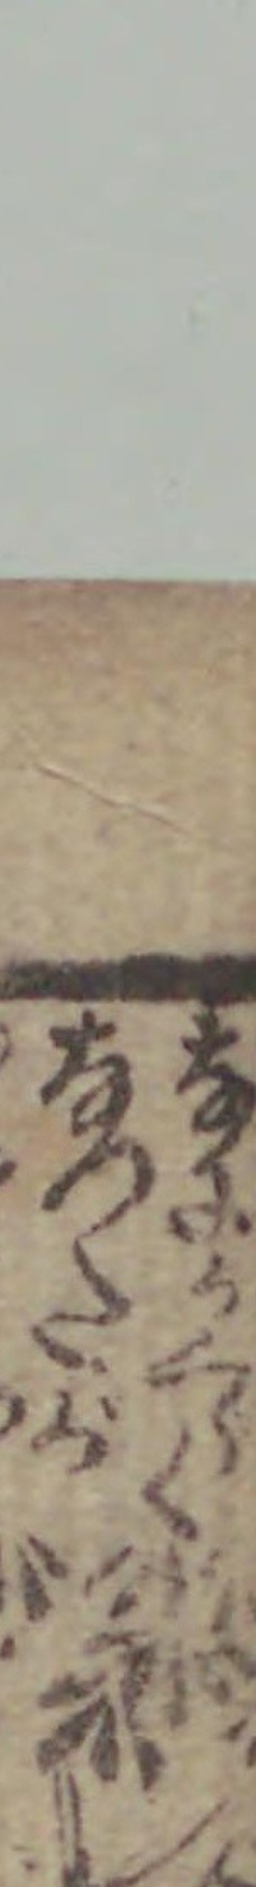なつたが
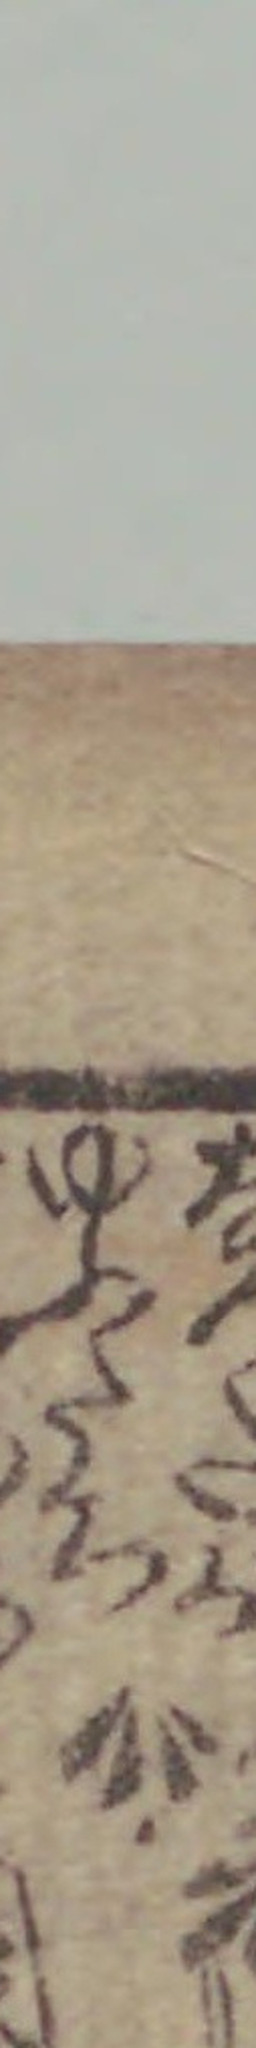ゆふたち
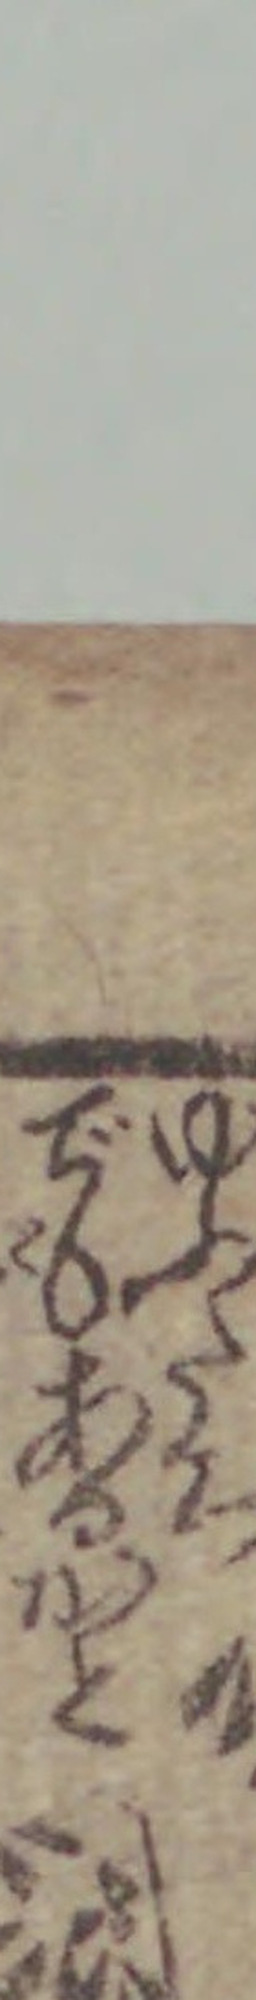でもあるかと
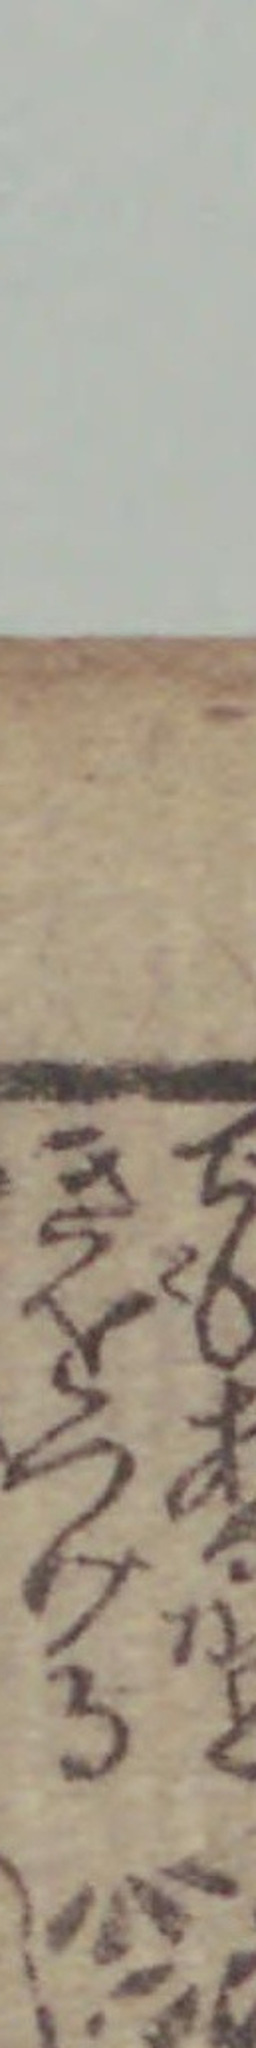きをつける
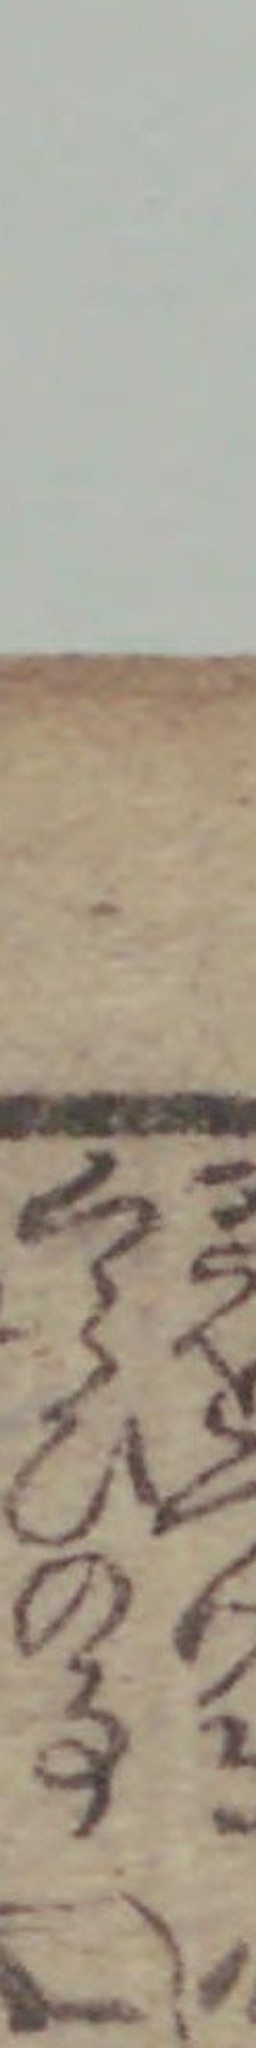くらひの事
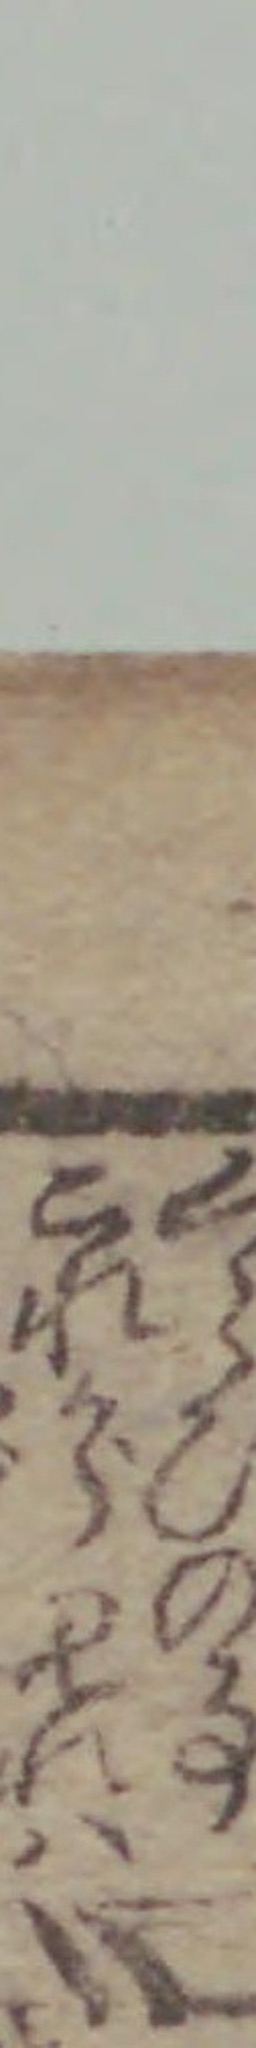これから見れは
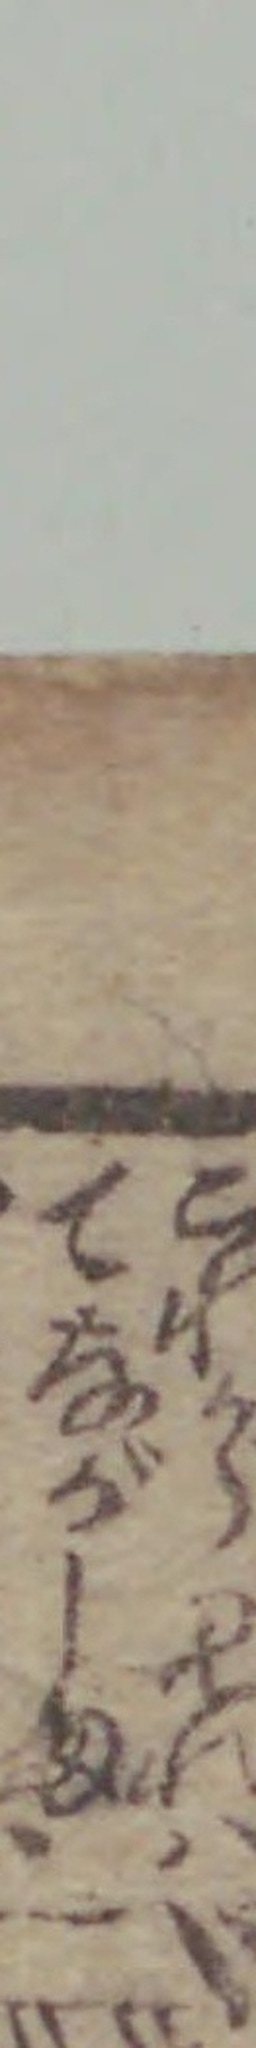てながしま
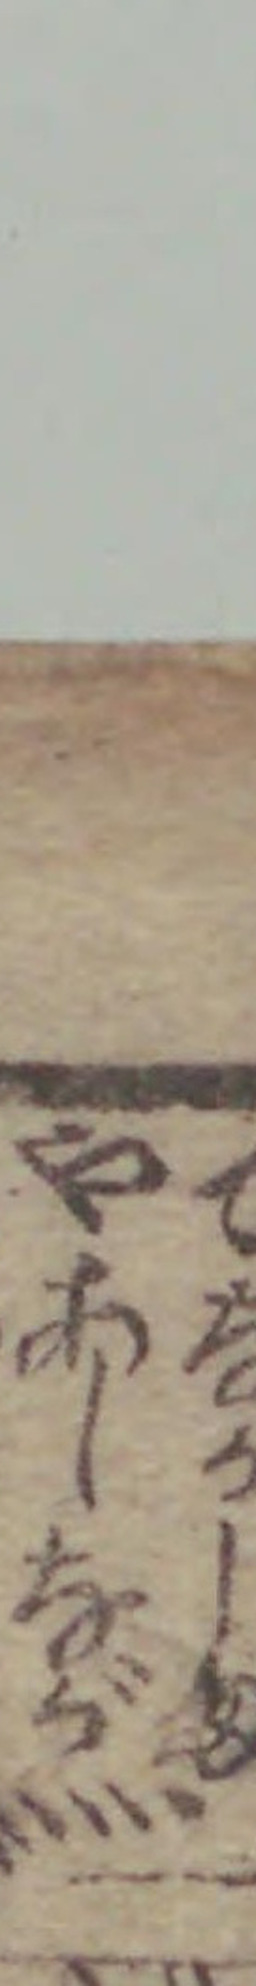やあしなが
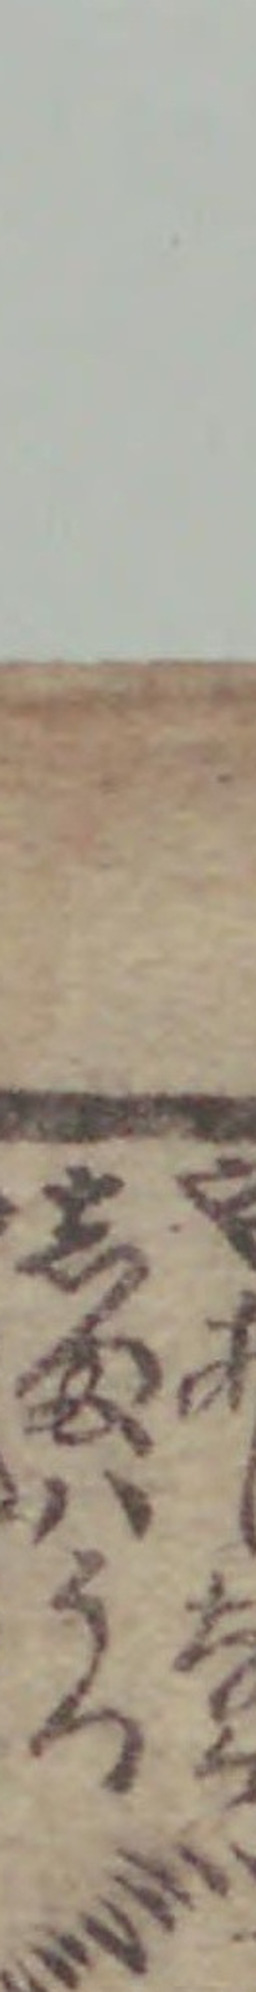しまはうつ
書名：近頃嶋めぐり 3巻
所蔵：国立国会図書館 National Diet Library, JAPAN
